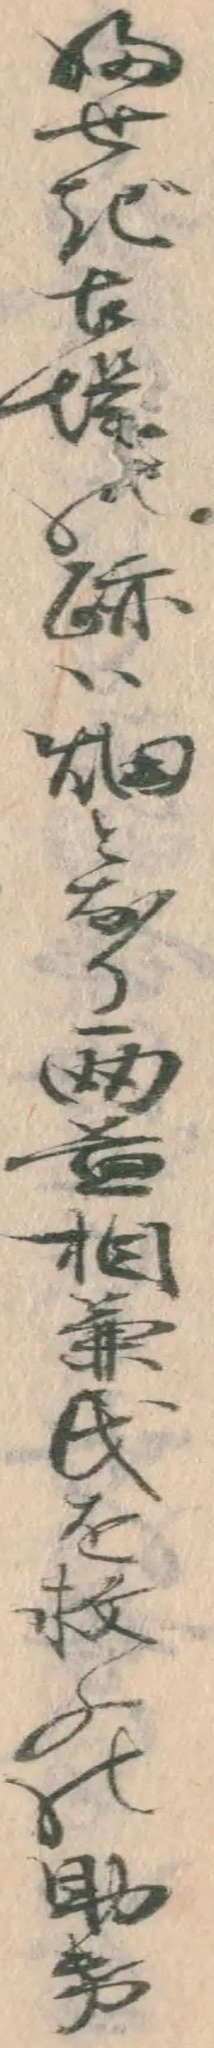ふせぎ古堤の跡は畑となり両益相兼民を救ふの助け
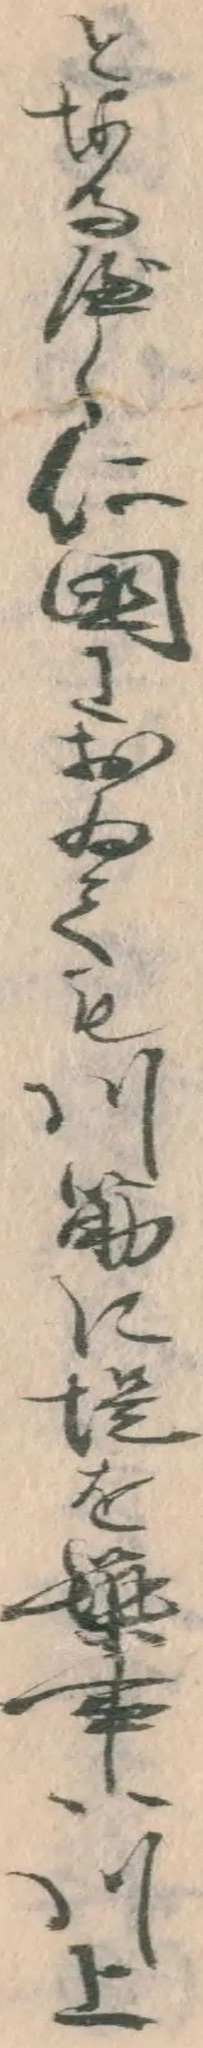となるべし何国におゐても川筋に堤を築事は川上
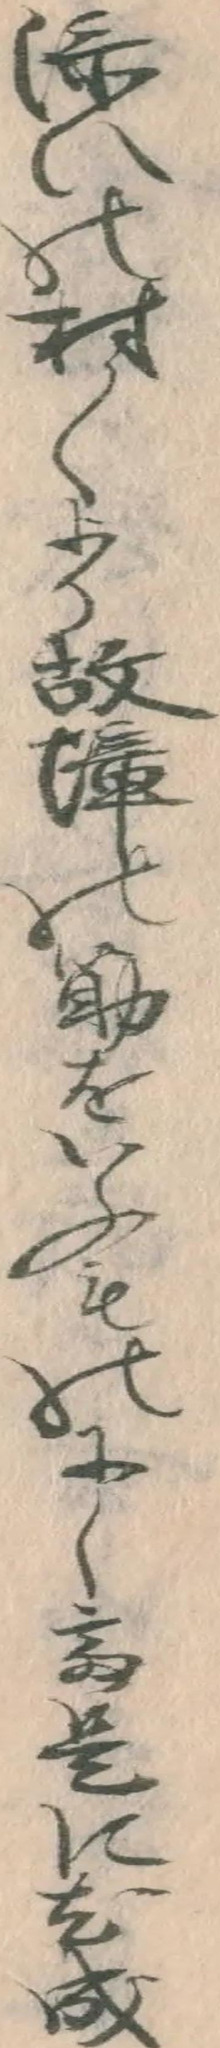添ひの村〳〵より故障の筋をいふものにして是に尤成
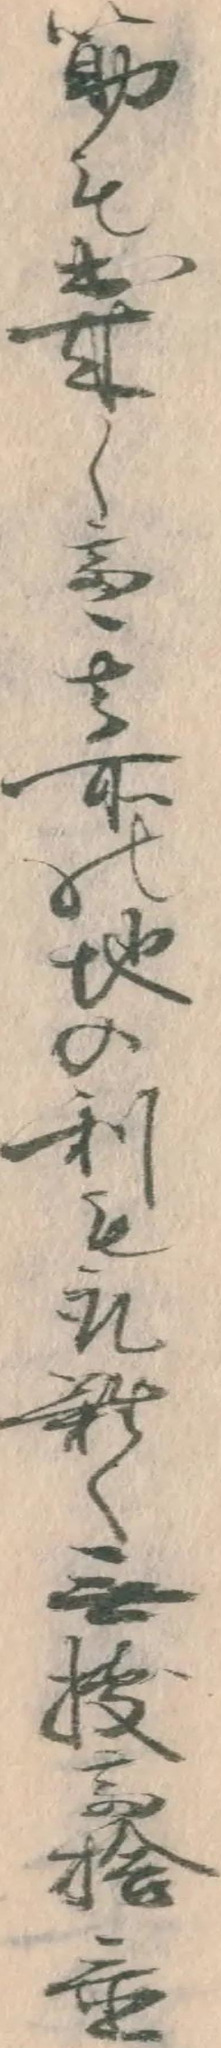筋も出来して其所の地の利も取難く無拠て捨置
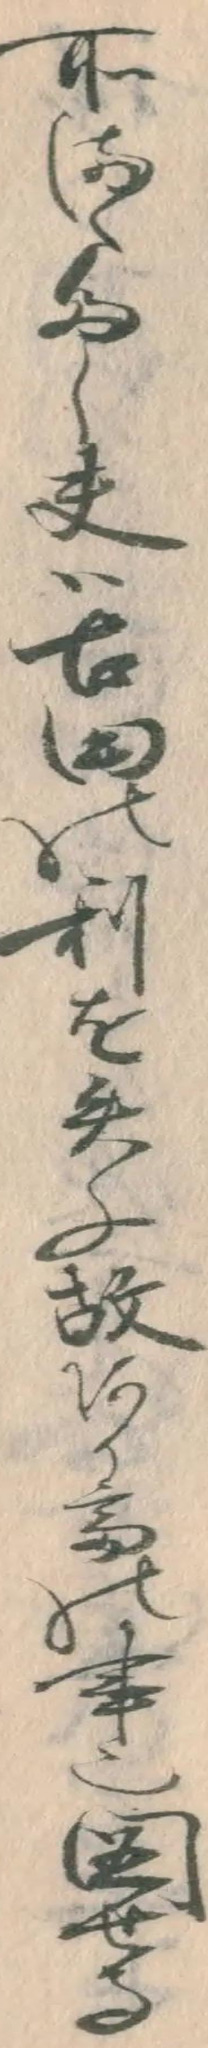所まゝ多し夫は古田の利を失ふ故ありての事也図せる
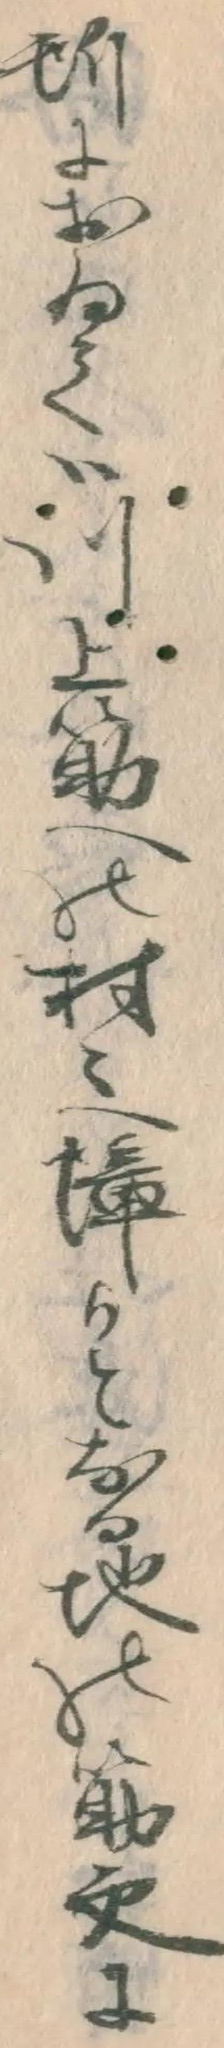所におゐては川上筋への村々へ障りとなる地の筋更に
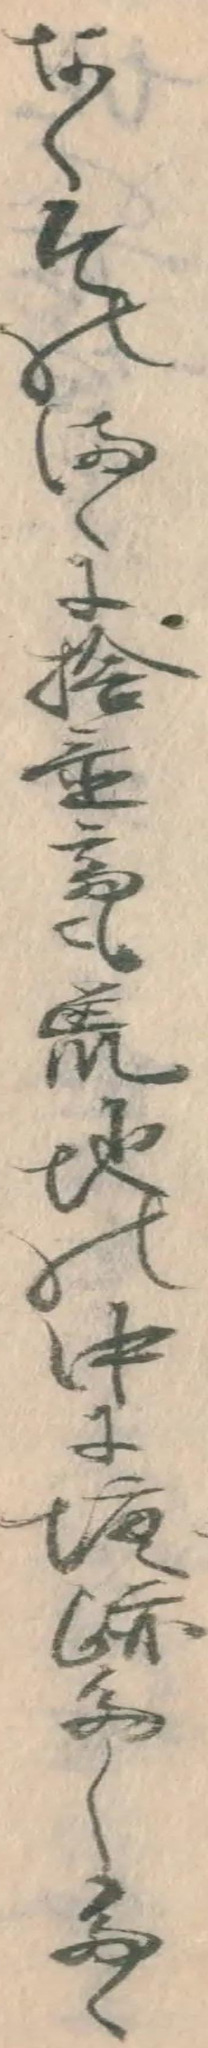なく今のまゝに捨置ても荒地の中に塘跡多したゝ

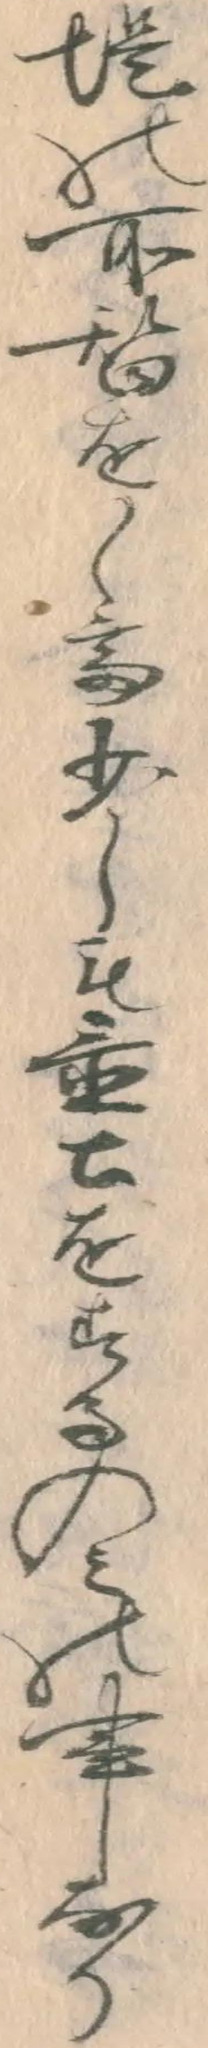堤の所替をして少しも置土をするのみの事なり
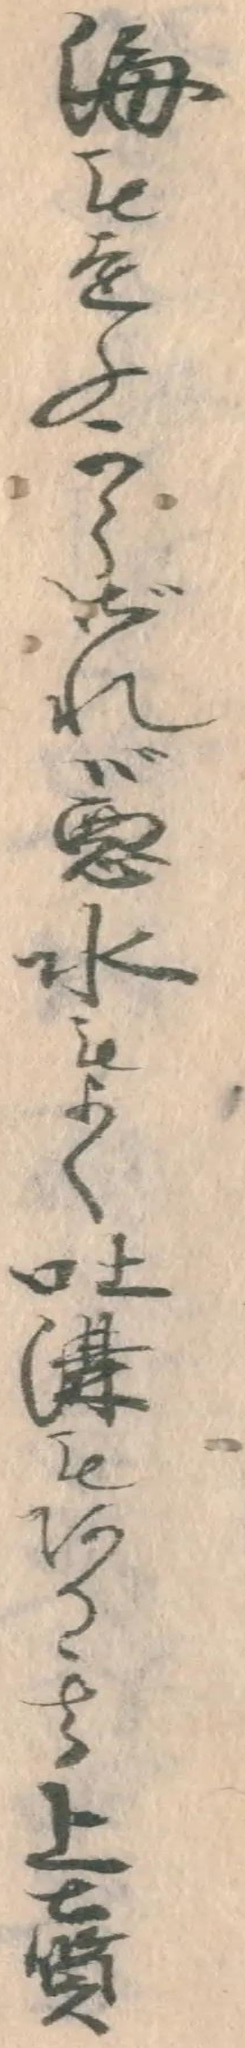海を遠ふからざれば悪水もよく吐溝もあり其上土質
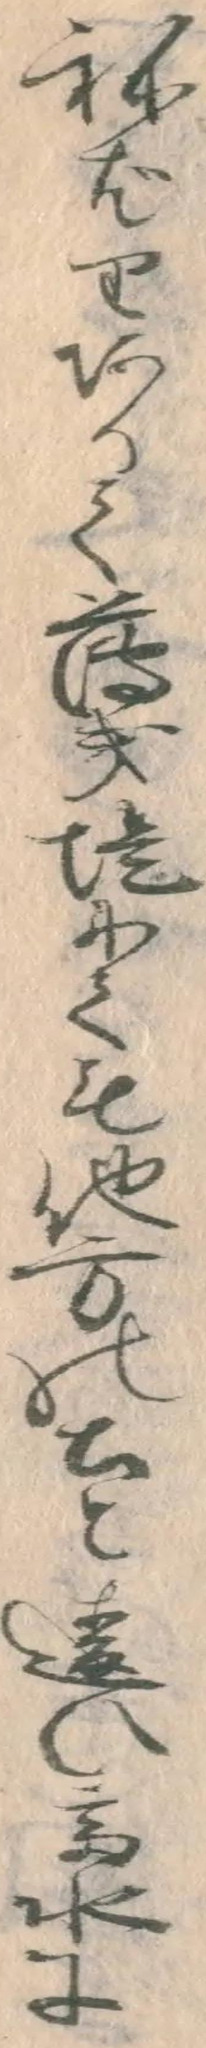ねばりありて薄き堤にても他方の土と違ひて水に
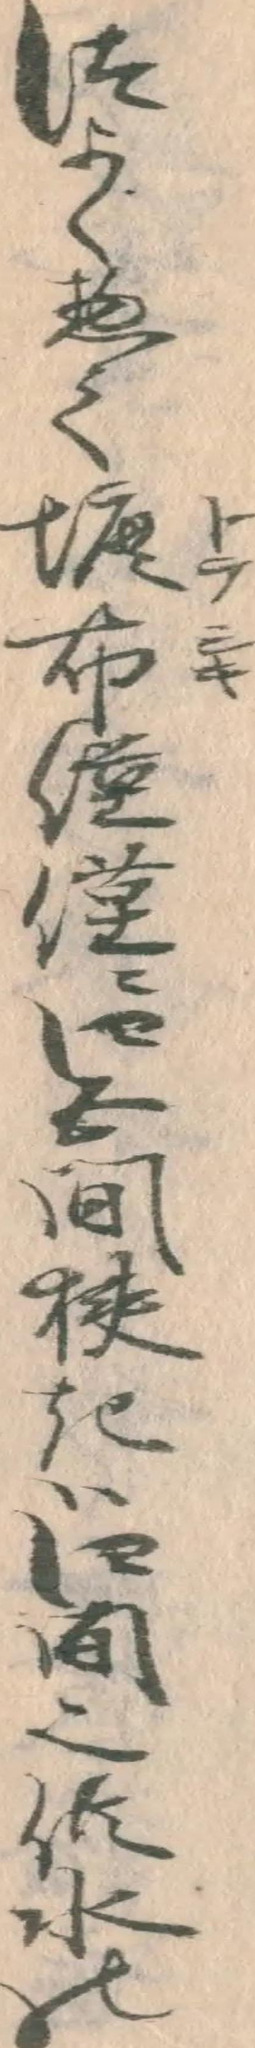つよく惣て塘布僅僅に四五間狭きは四間也洪水の
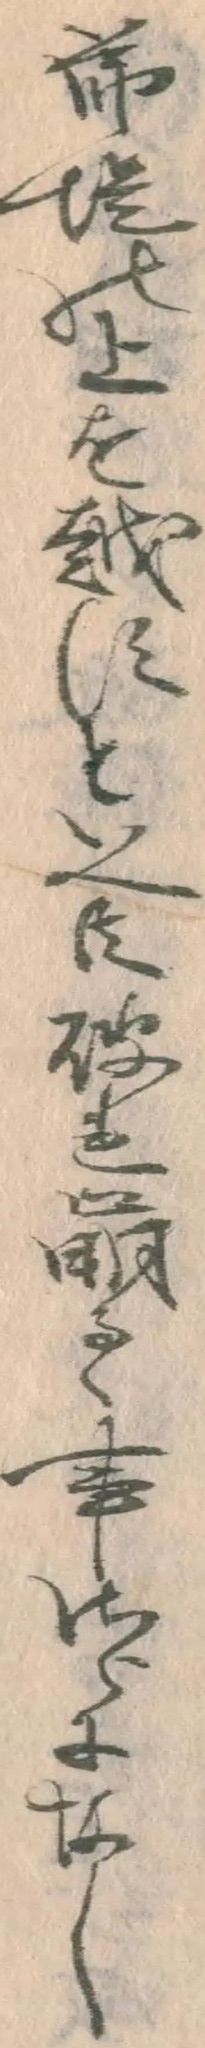節堤の上を越すといへ共破れ崩るゝ事さらになし
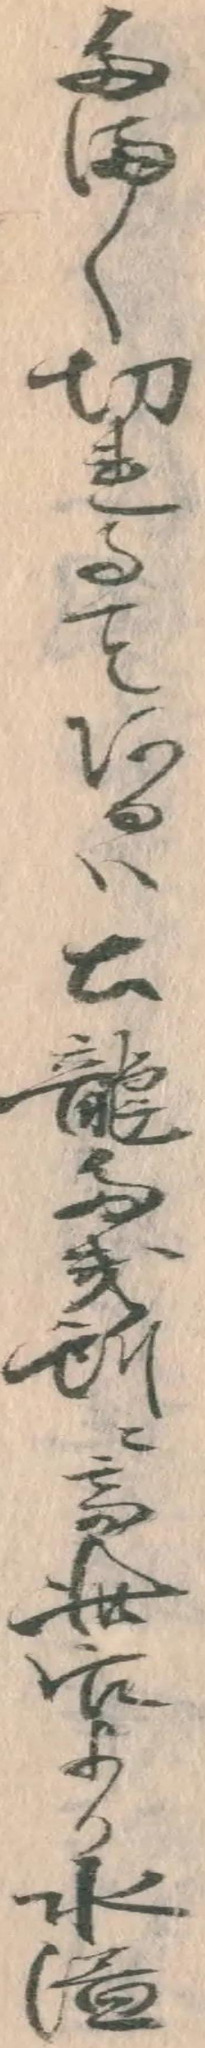たま〳〵切るゝことあるは土竜多き所にて此穴より水溢
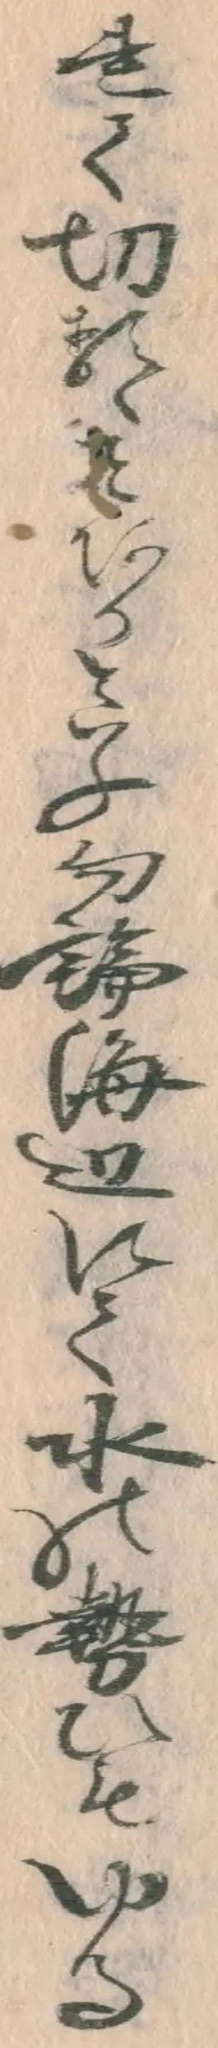れて切るゝことありといふ勿論海辺にて水の勢ひもゆる
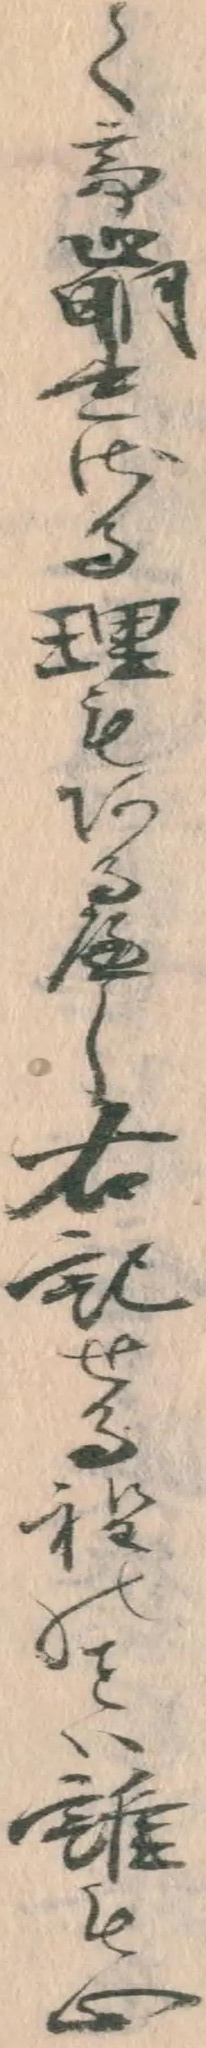くて崩れざる理もあるへし右記せる程のことは誰も心
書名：四神地名録 6巻. [4]葛飾郡
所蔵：国立国会図書館 National Diet Library, JAPAN
